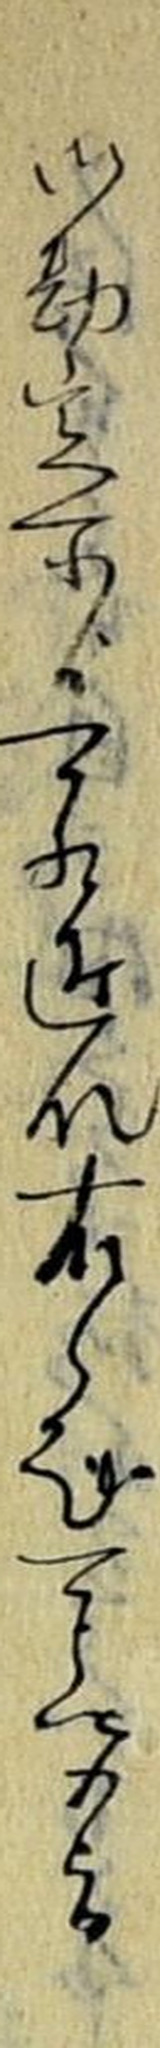御勘定所ゟ可相達段右之趣可被申聞旨
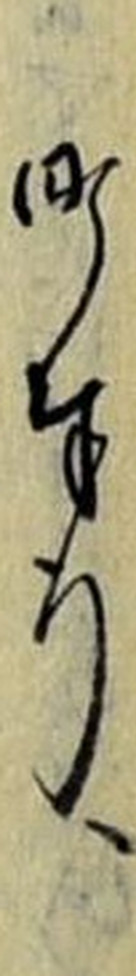御奉行へ
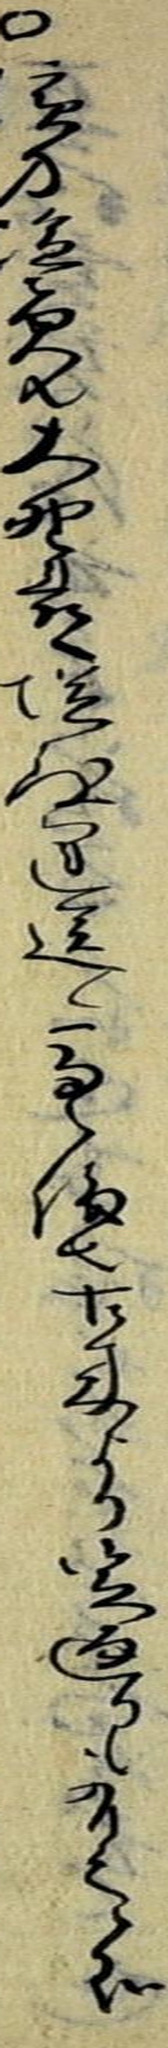○諸方塩売共大野表へ塩致運送候馬之儀は古来ゟ定通りも有之候処
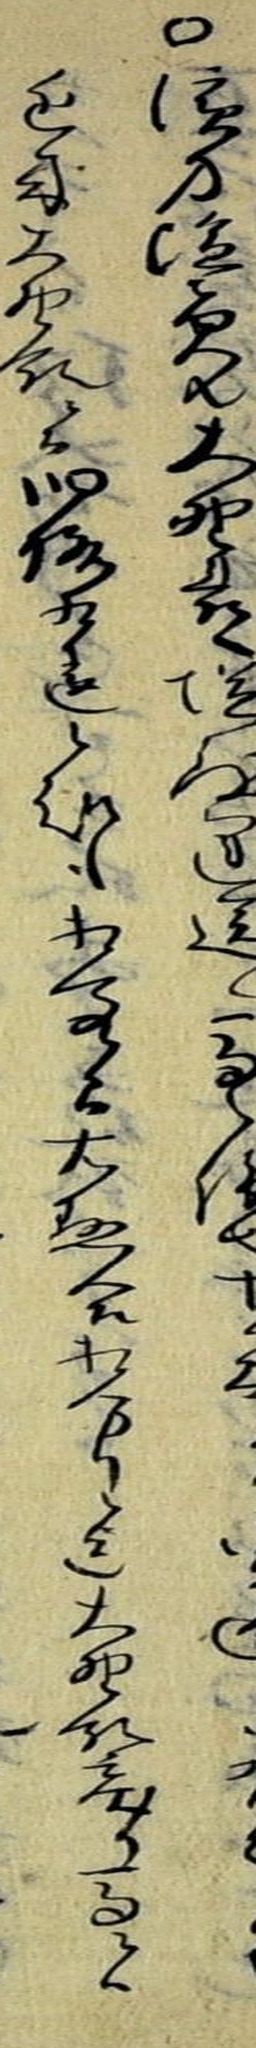近来大野領に而旧格相違候趣も相聞候間右懸合相分り候迄大野領戻り馬には
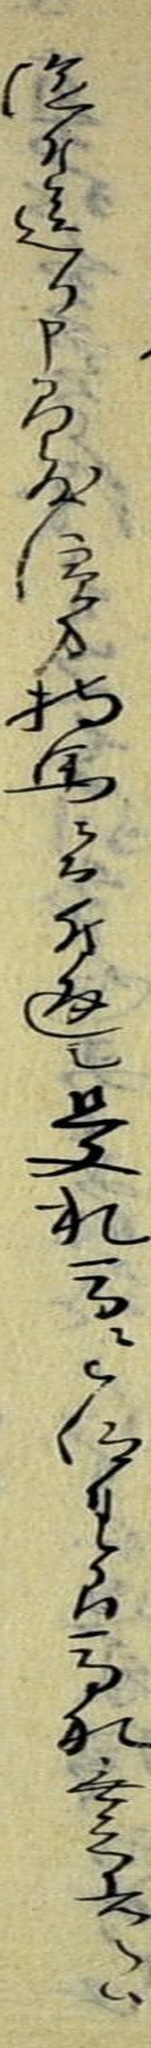塩付送り申間敷浜方持馬に而付通し且又札馬に被仰付候間馬札無之者へは
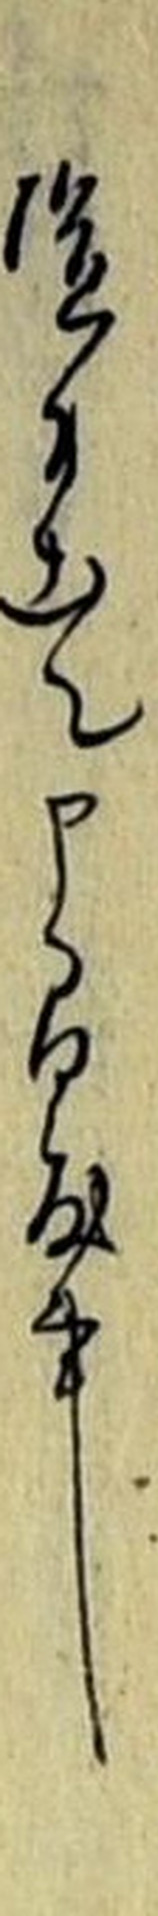塩付出し申間敷事
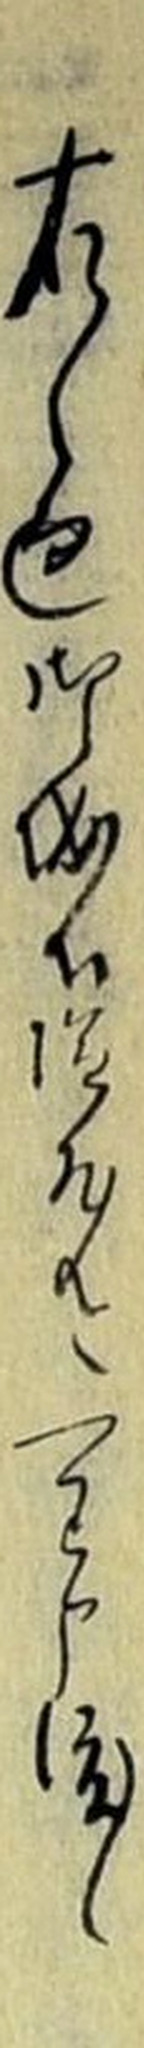右之通御城下塩屋共へ可被申渡候
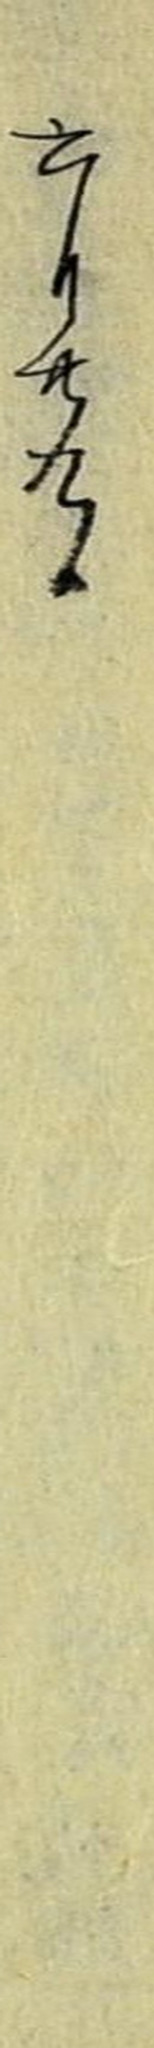六月廿九日
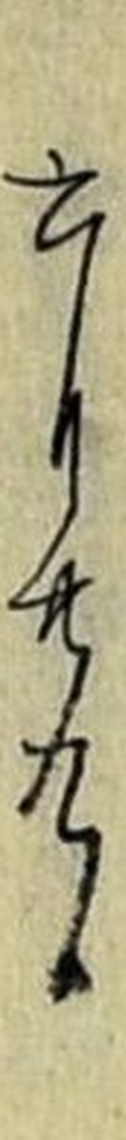六月廿九日
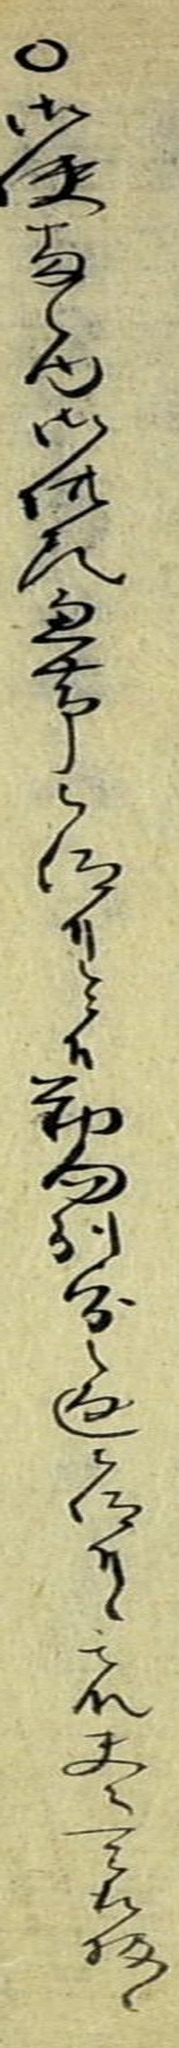○御使番之内御供頭兼帯被仰付候に付勤向別紙之通被仰付候其段夫々可被取扱候
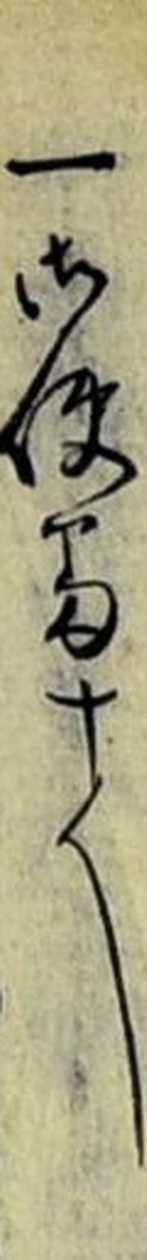一御使番十人
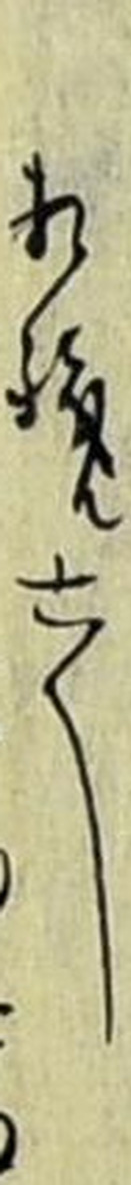相残ル六人
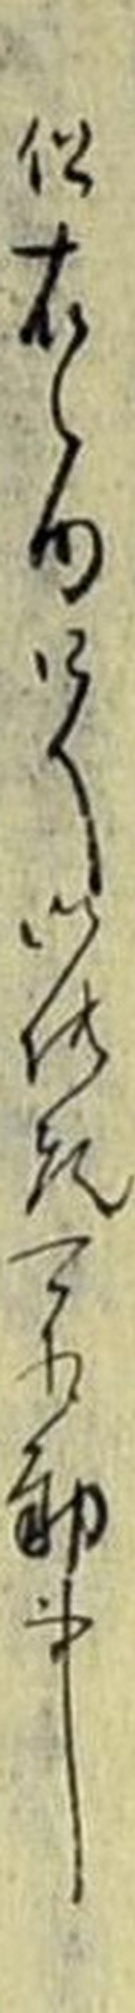但右之内四人御供頭可相勤事
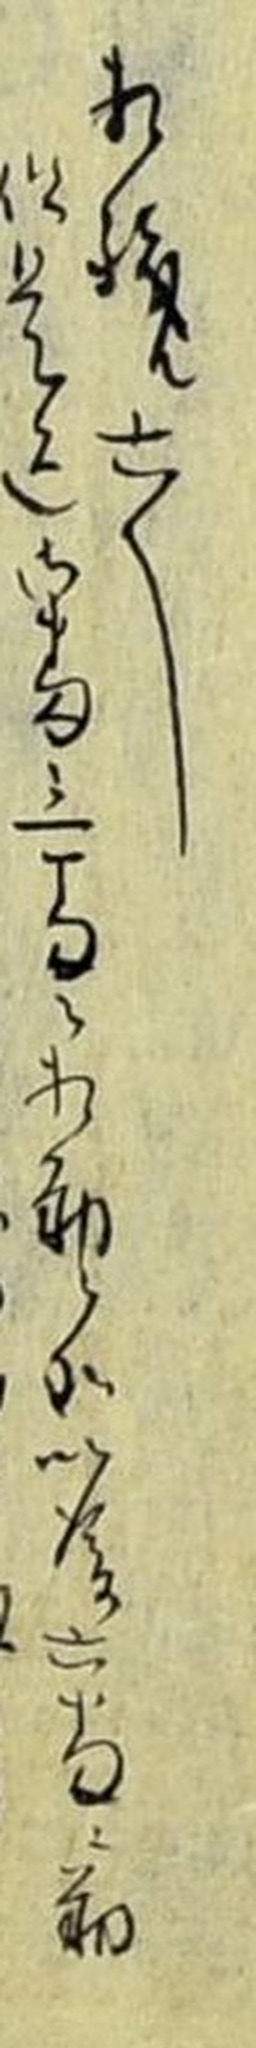但是迄御番三番に相勤候処以後六番に勤
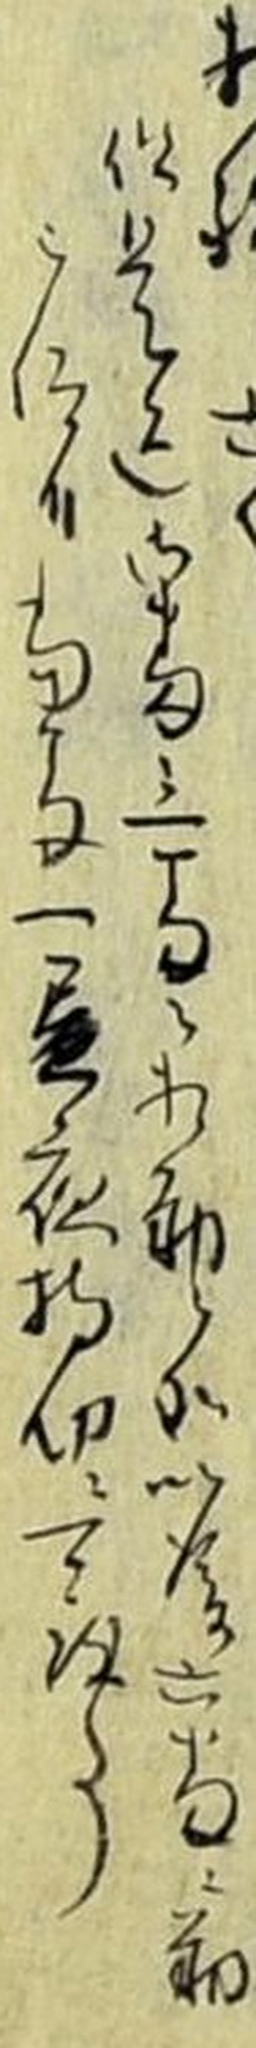被仰付当番一昼夜持切に可致事
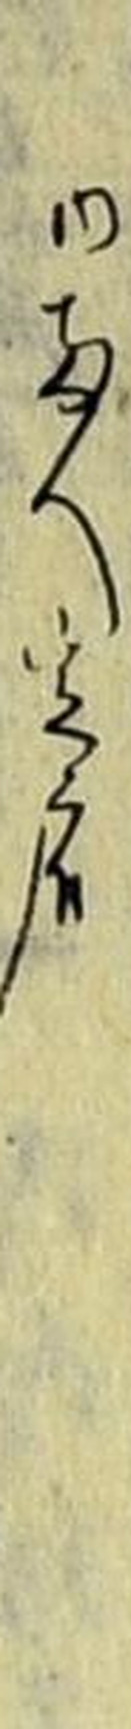内両人定府
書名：命令之部 四
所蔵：福井県文書館 Fukui Prefectural Archives
